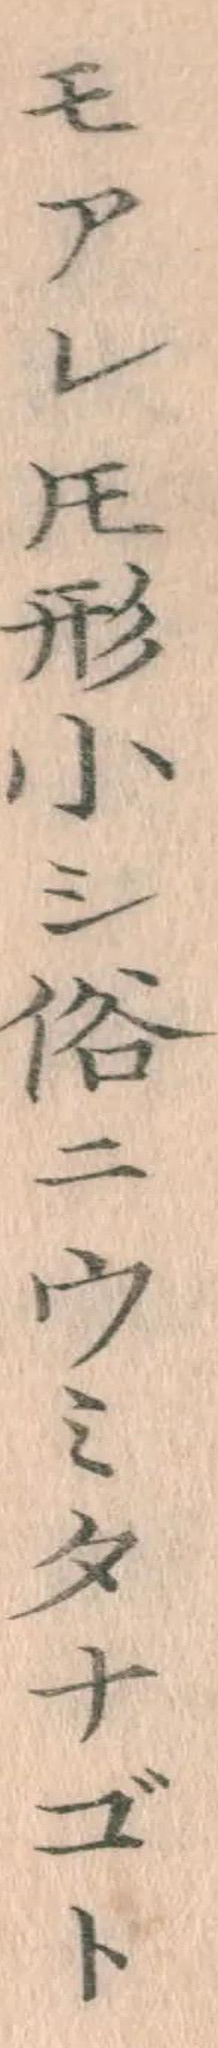モアレトモ形小シ俗ニウミタナゴト
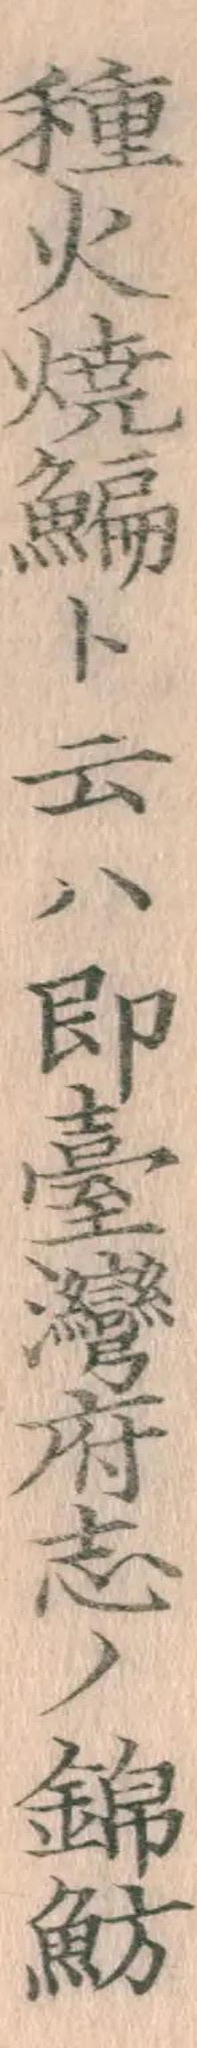種火焼鯿ト云ハ即台湾府志ノ錦魴
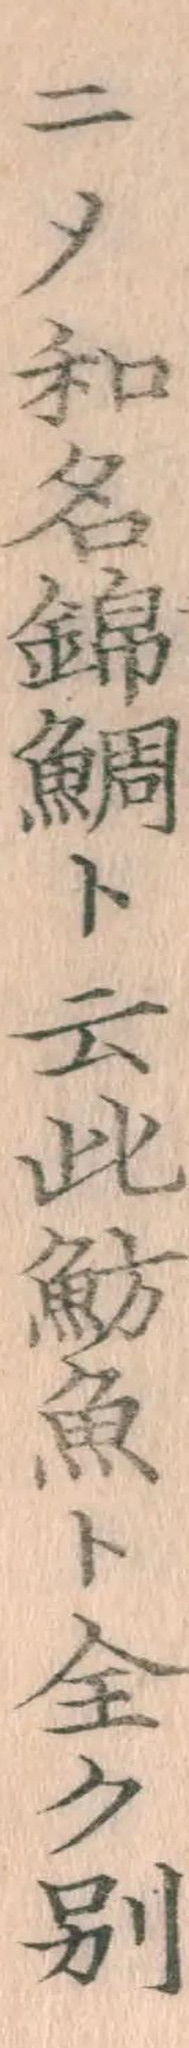ニシテ和名錦鯛ト云此魴魚ト全ク別
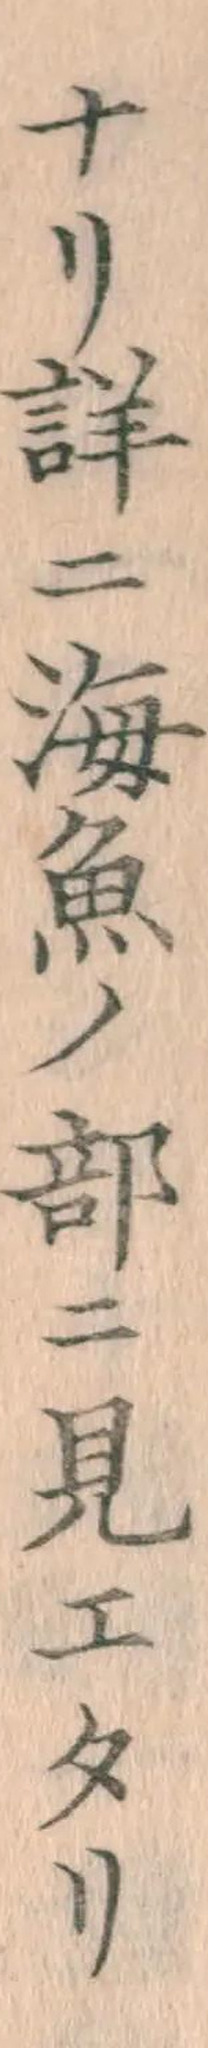ナリ詳ニ海魚ノ部ニ見エタリ
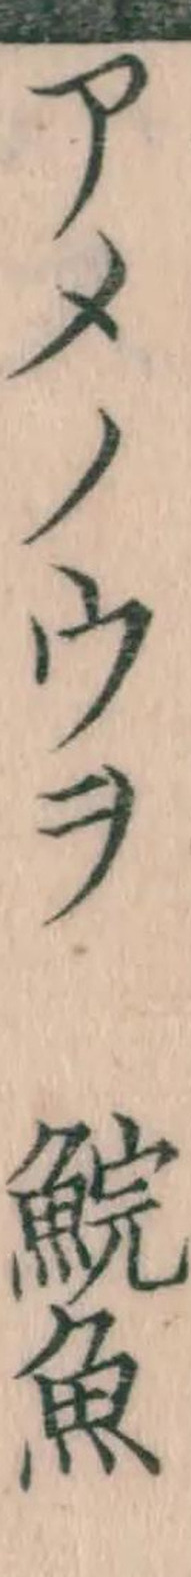アメノウヲ鯇魚
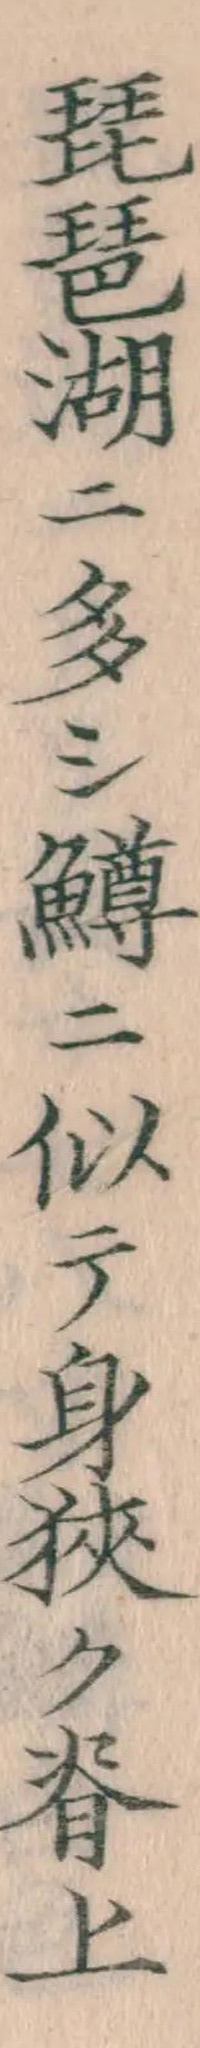琵琶湖ニ多シ鱒ニ似テ身狭ク背上
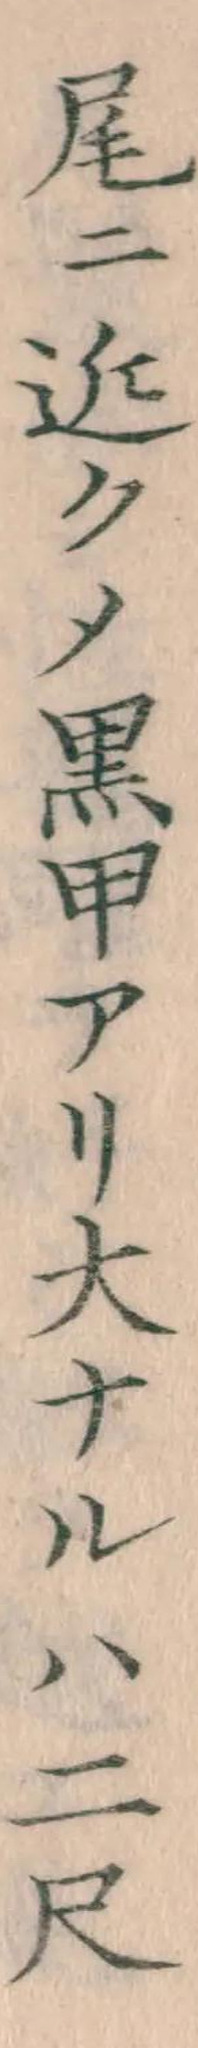尾ニ近クシテ黒甲アリ大ナルハ二尺
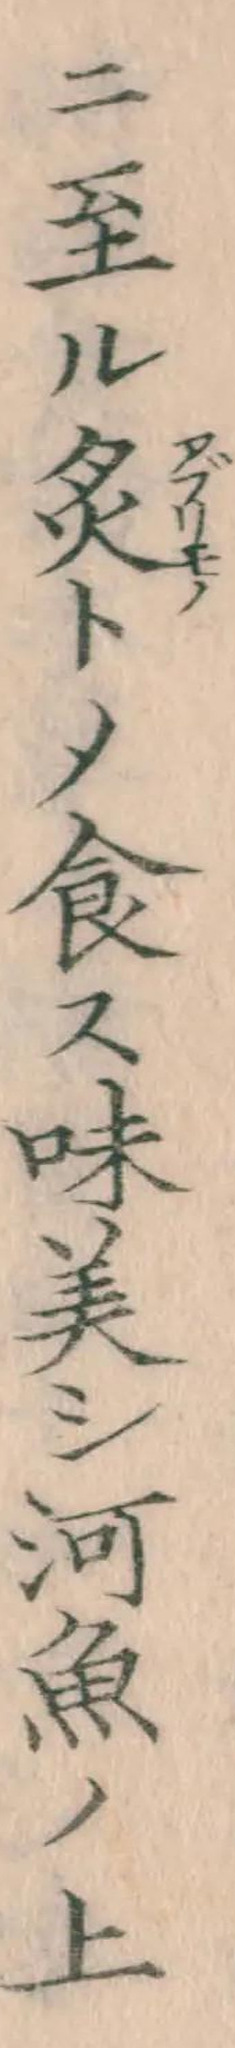ニ至ル炙トシテ食ス味美シ河魚ノ上
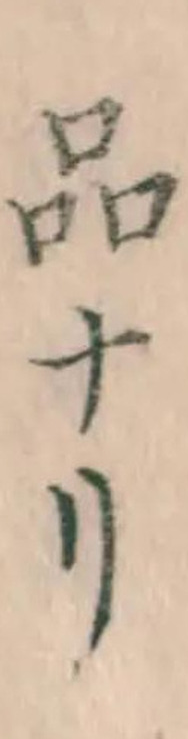品ナリ

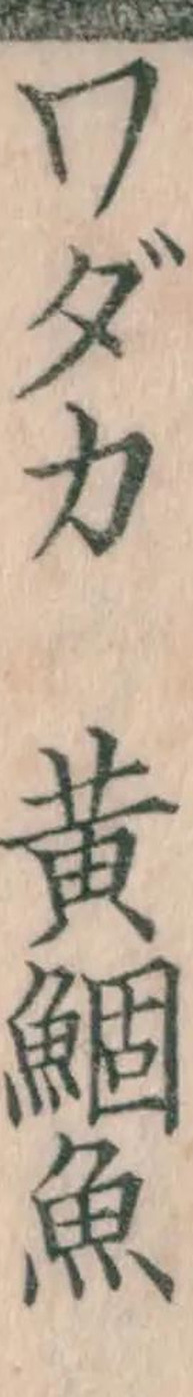ワダカ黄鯝魚
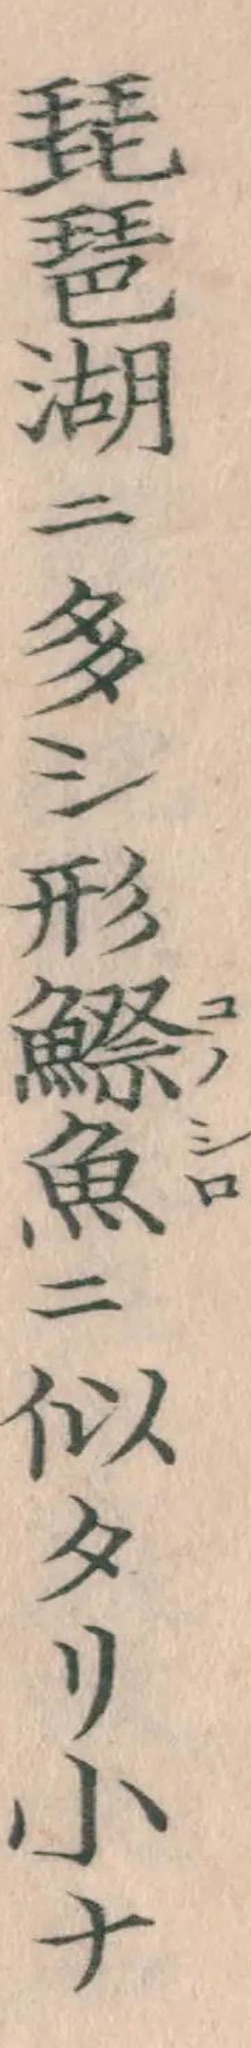琵琶湖ニ多シ形鰶魚ニ似タリ小ナ
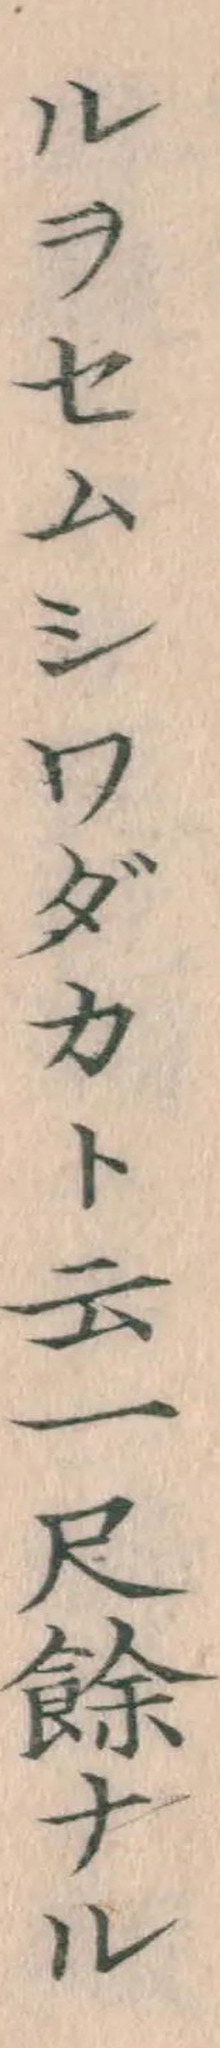ルヲセムシワダカト云一尺余ナル
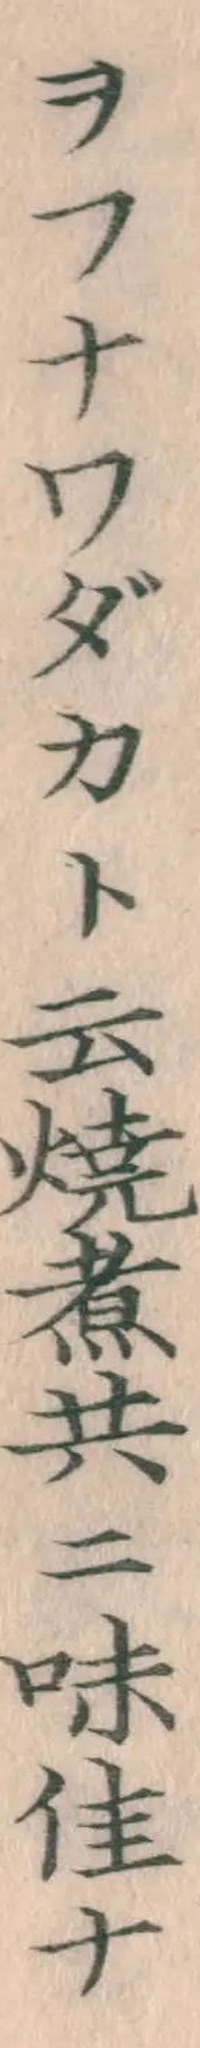ヲフナワダカト云焼煮共ニ味佳ナ
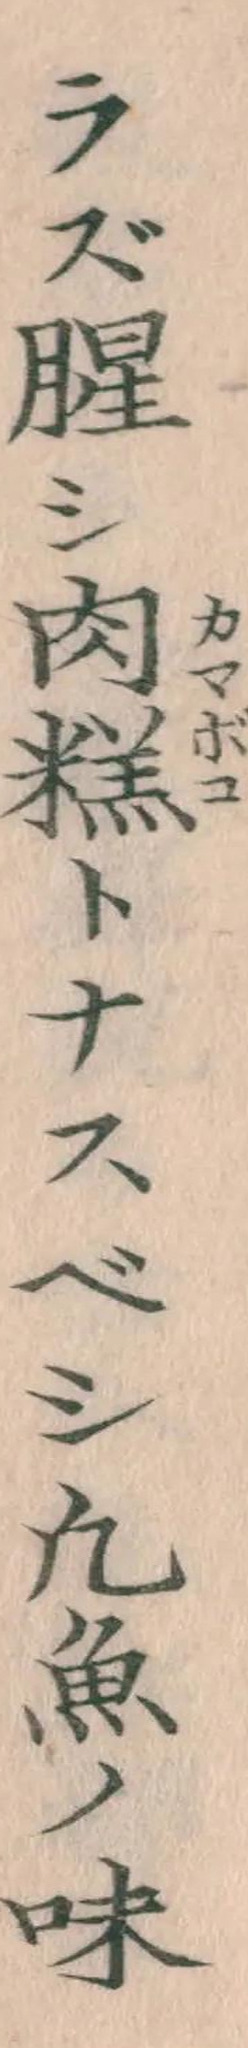ラズ腥シ肉糕トナスベシ凡魚ノ味
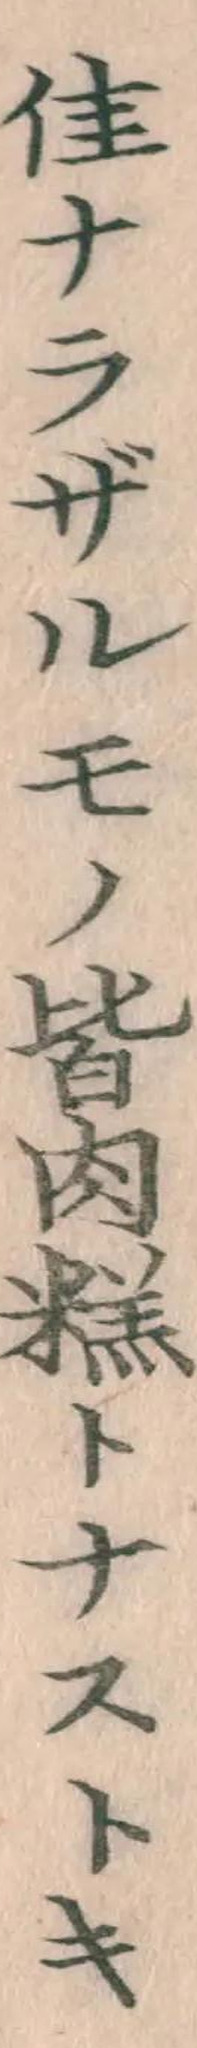佳ナラザルモノ皆肉糕トナストキ
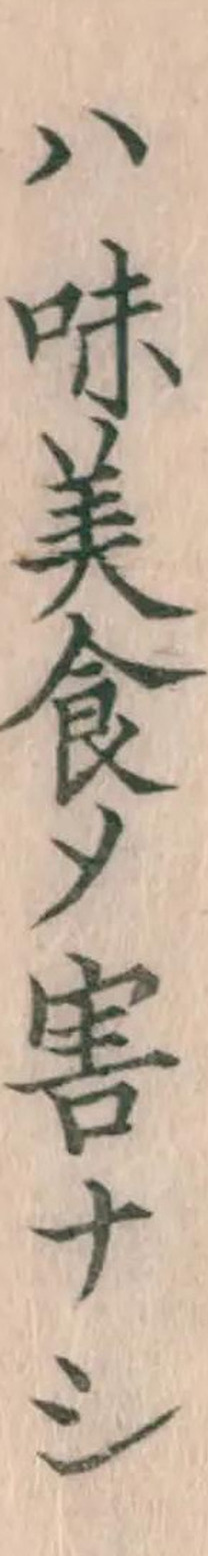ハ味美食シテ害ナシ
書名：皇和魚譜 2巻
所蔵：国立国会図書館 National Diet Library, JAPAN
